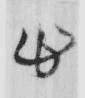心
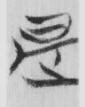是
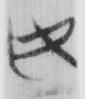女
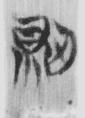則
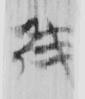隹
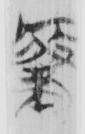肇
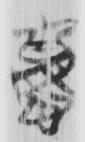悽
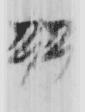弜
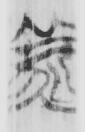羕
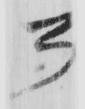乃
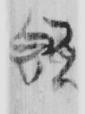即
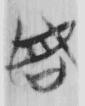{母口}
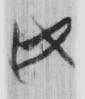女
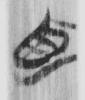廼
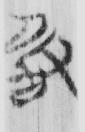敢
